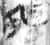寅
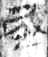城（成）
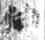於
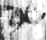卯
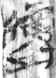○（復）
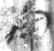於
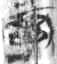晨
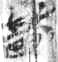○（怨）
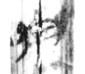於
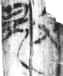○（媚）
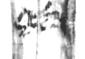於
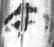午
